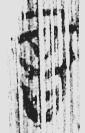言
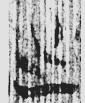之
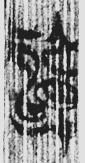○（瀆）
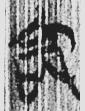命（令）
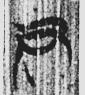尹
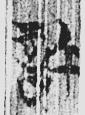許
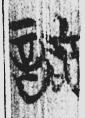諾
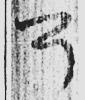乃
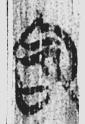命
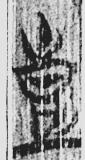彭
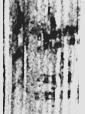徒
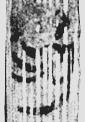爲
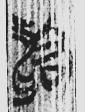洛
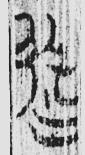○（卜）
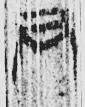尹
